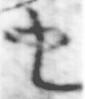屯
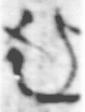狐
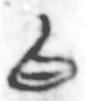白
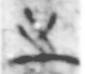之
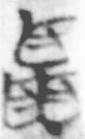聶（攝）
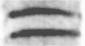二
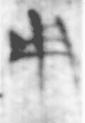用
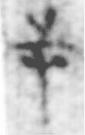矢
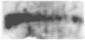一
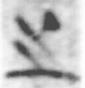之
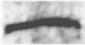一
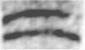二
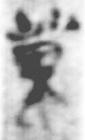菓（戈）
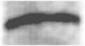一
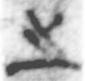之
